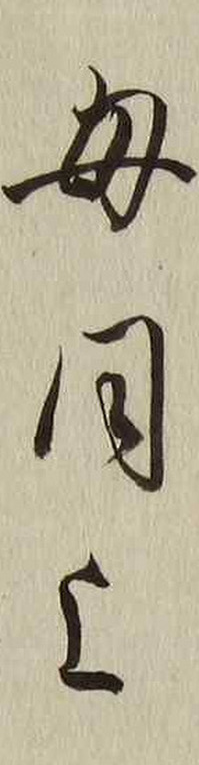母同上
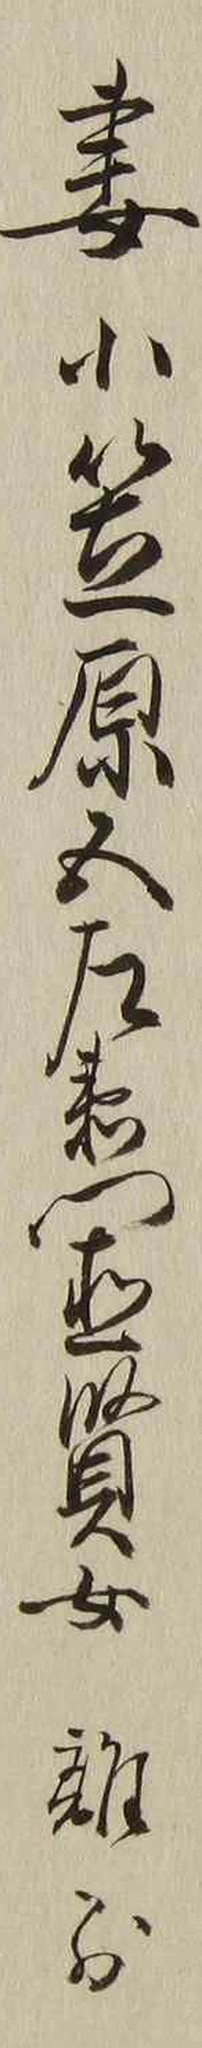妻小笠原五左衛門直賢女離別

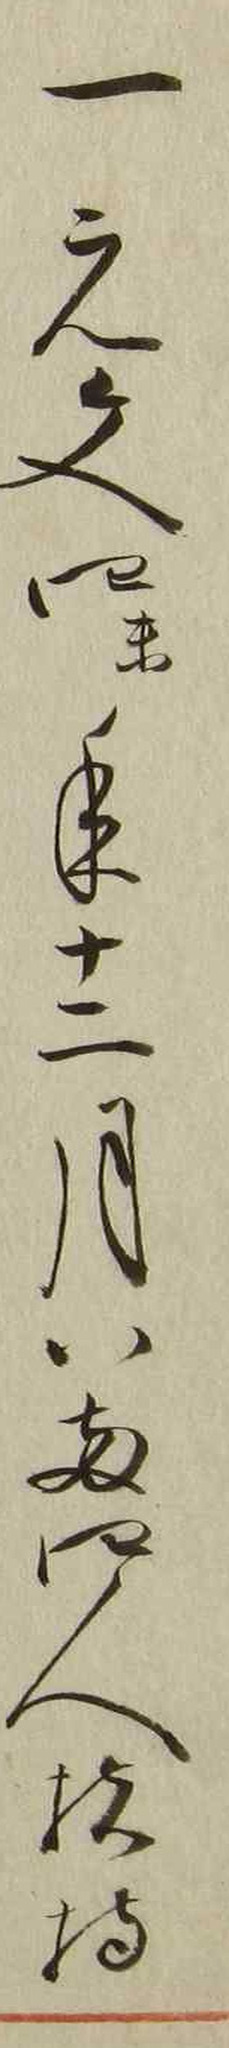一元文四未年十二月八両四人扶持
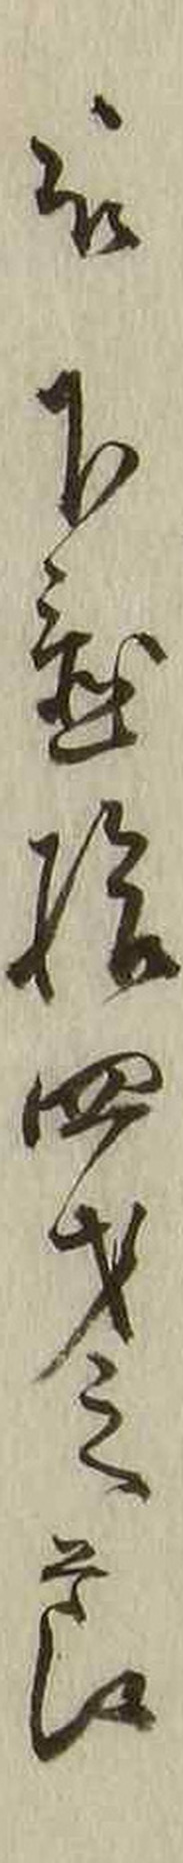被下置拾四才之節
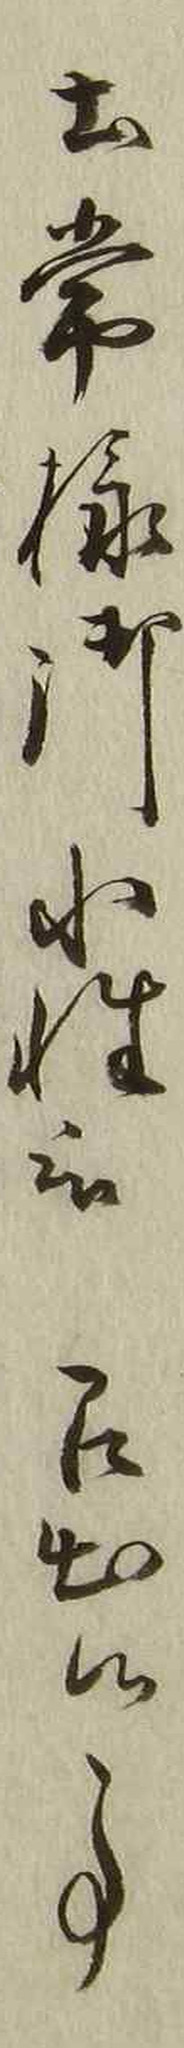土常様御小性被召出候事
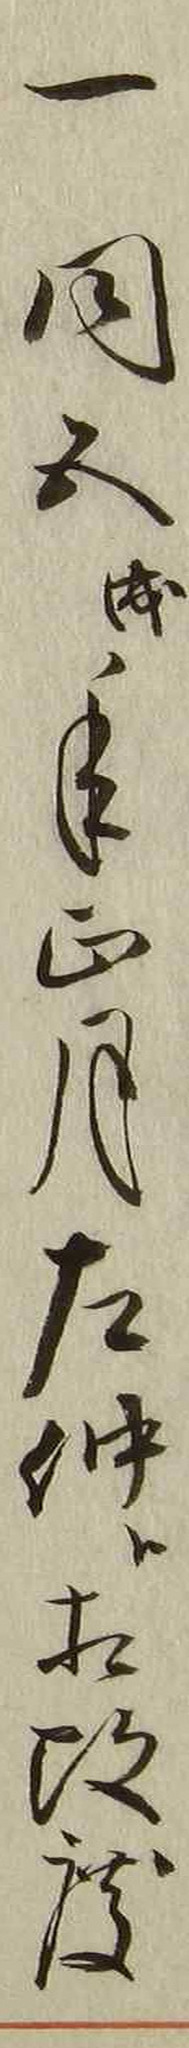一同五戌年正月左仲ト相改度
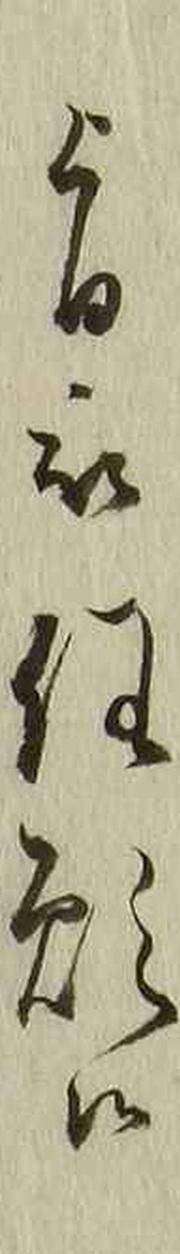旨被任願候
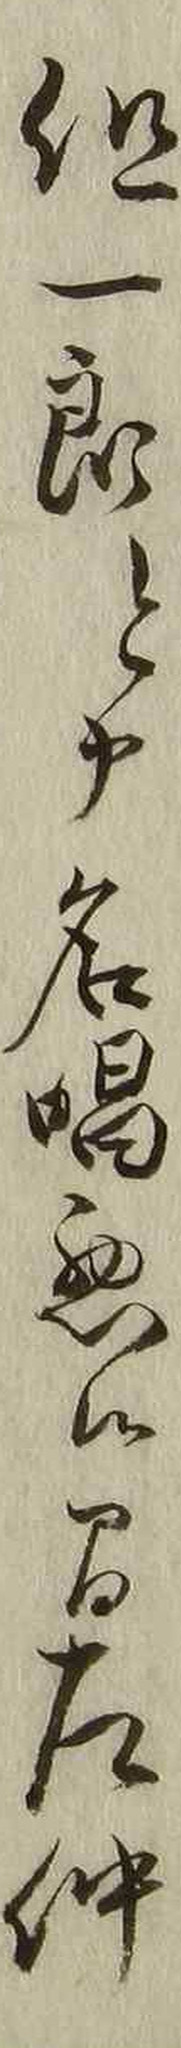但一郎と申名唱悪候間左仲
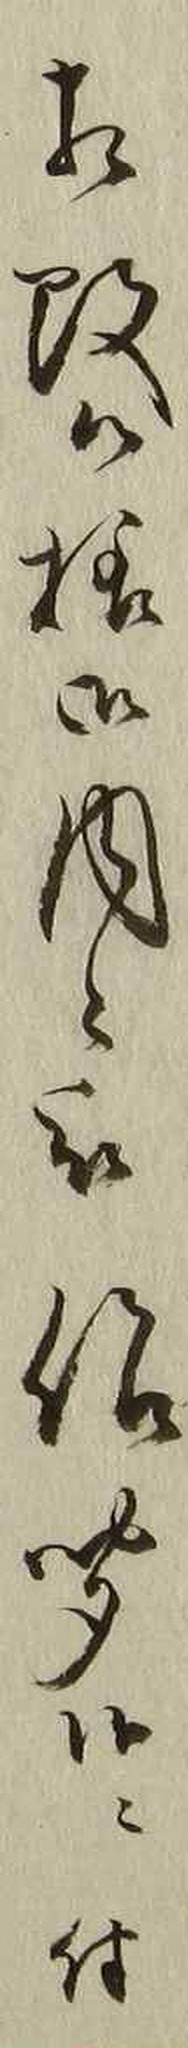相改候様御内々被仰聞候ニ付
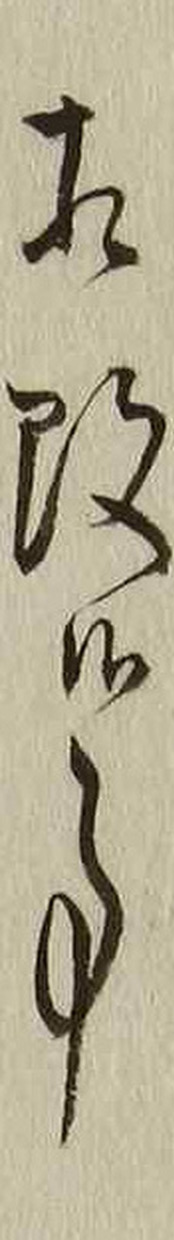相改候事
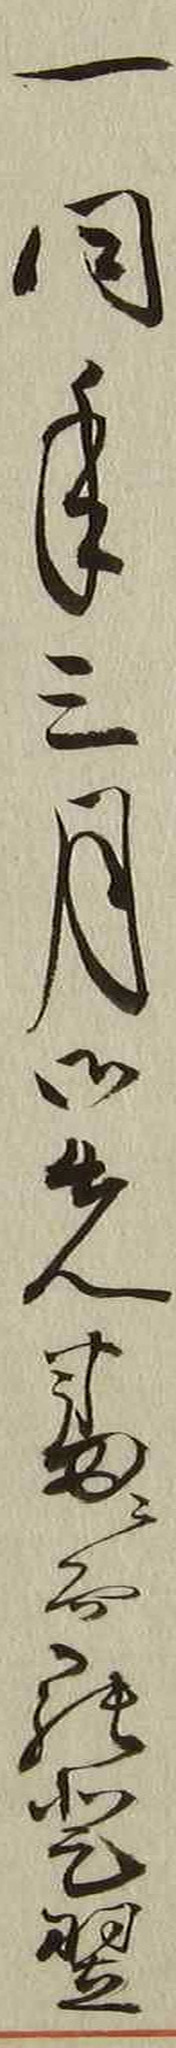一同年三月御先番ニ而罷登翌
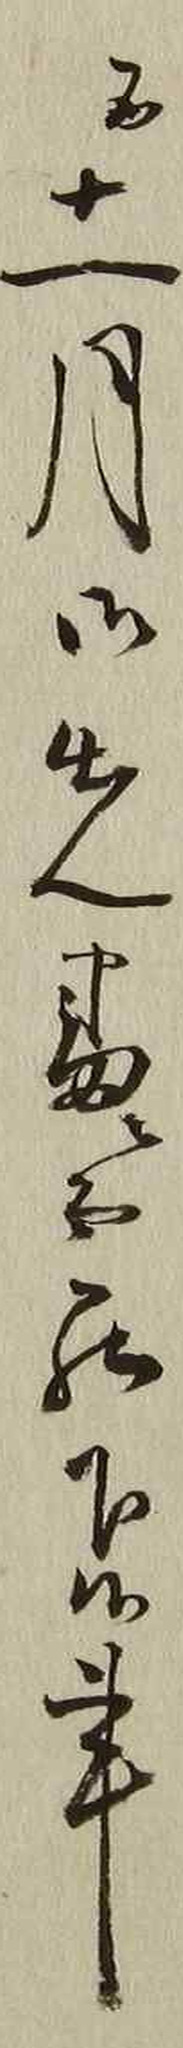酉十一月御先番ニ而罷下候事
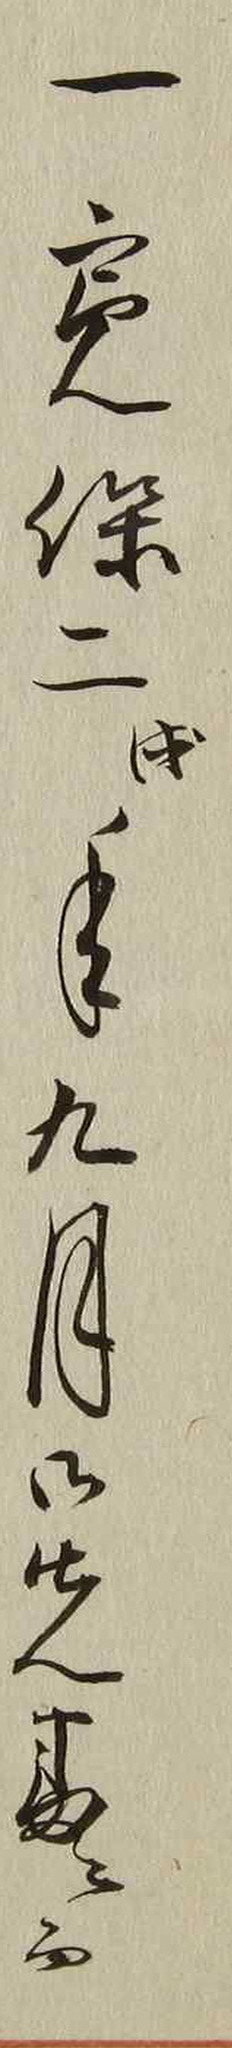一寛保二戌年九月御先番ニ而
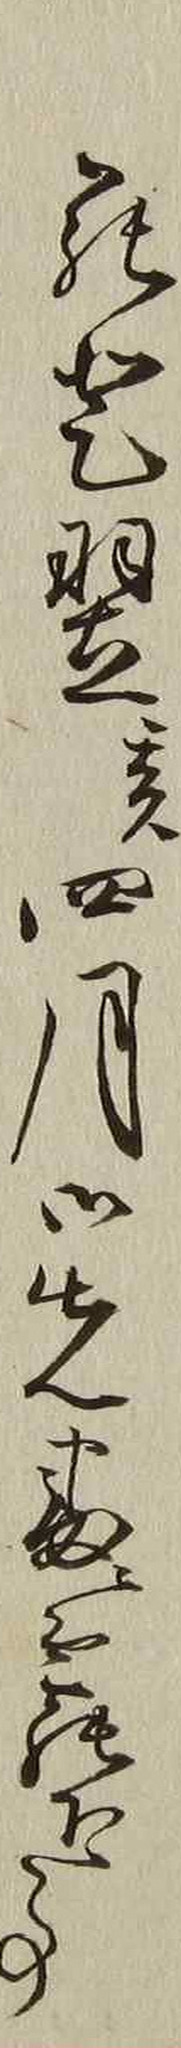罷登翌亥四月御先番ニ而罷下候事
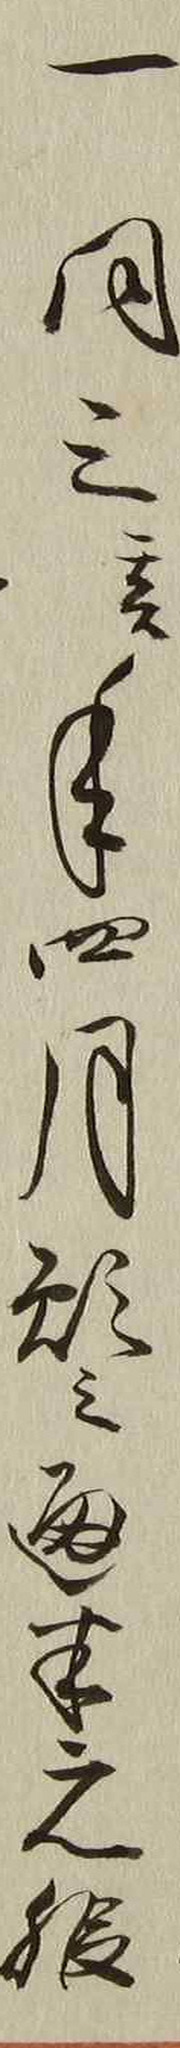一同三亥年四月願之通半元服
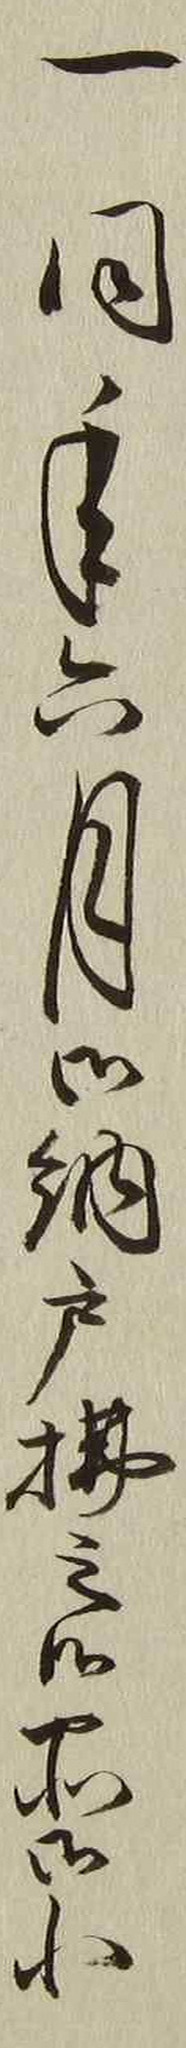一同年六月御納戸払之御品御小
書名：諸士系譜　巻之57　ほ之部4
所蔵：会津若松市立会津図書館
